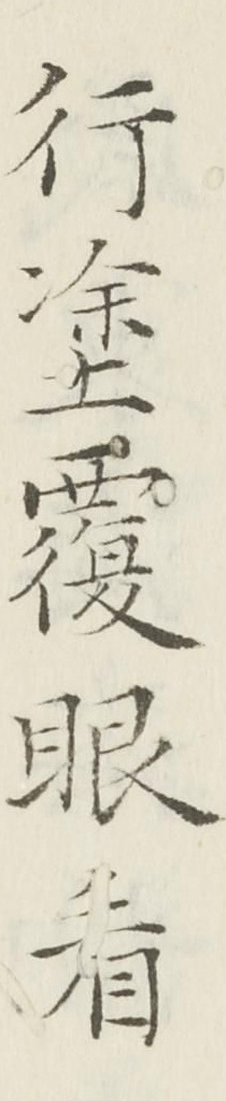行塗覆眼看
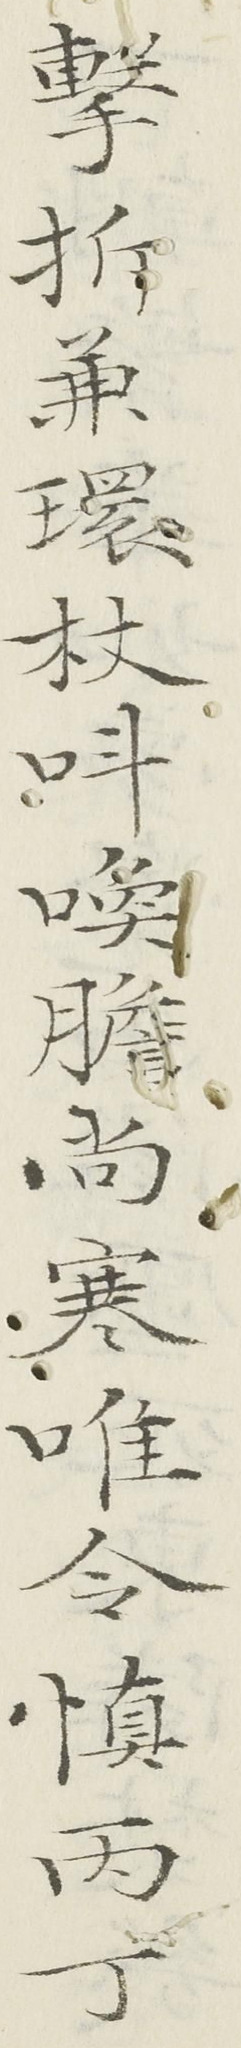撃折兼環杖呌喚騰尚寒唯令慎丙丁
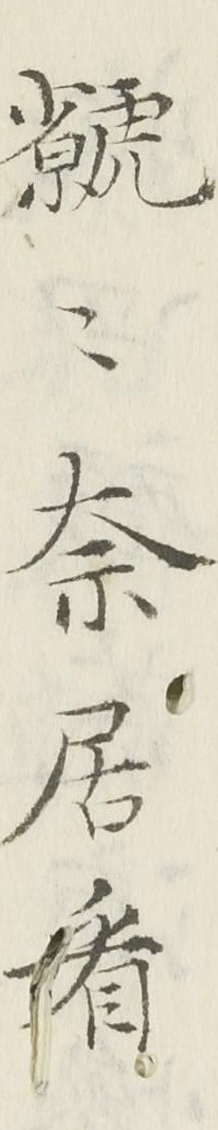虩々奈居肴
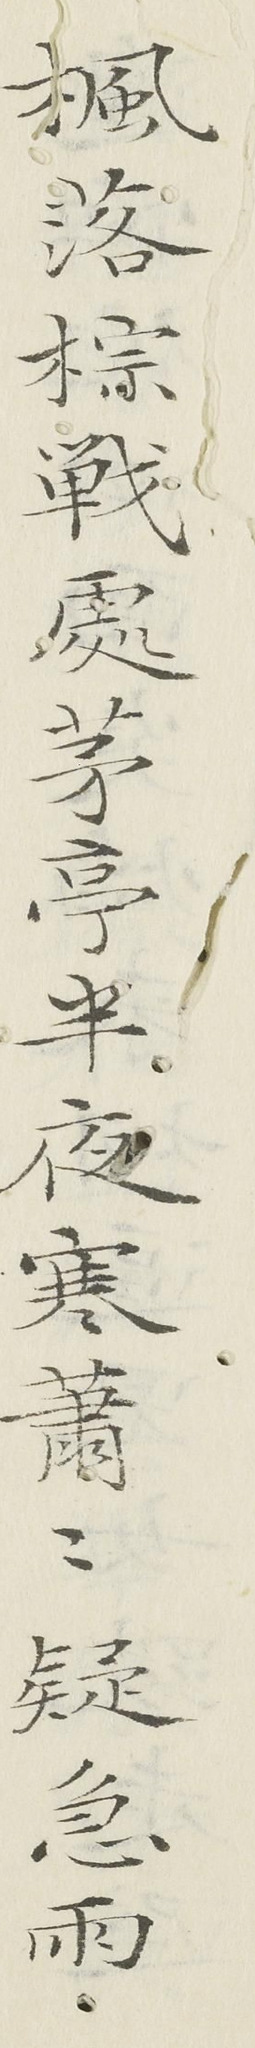楓落棕戦処茅亭半夜寒粛々疑急雨
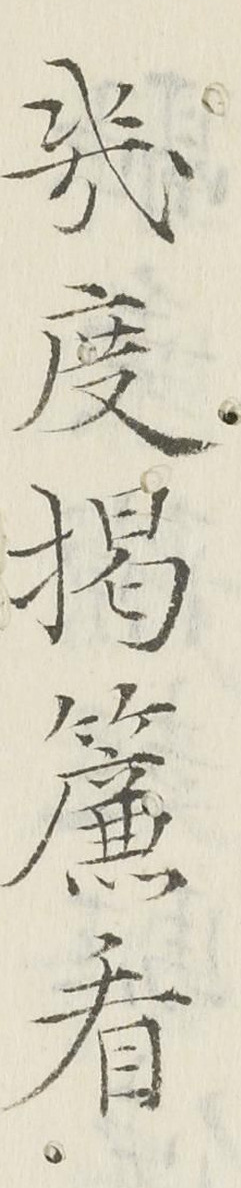幾度掲簾看
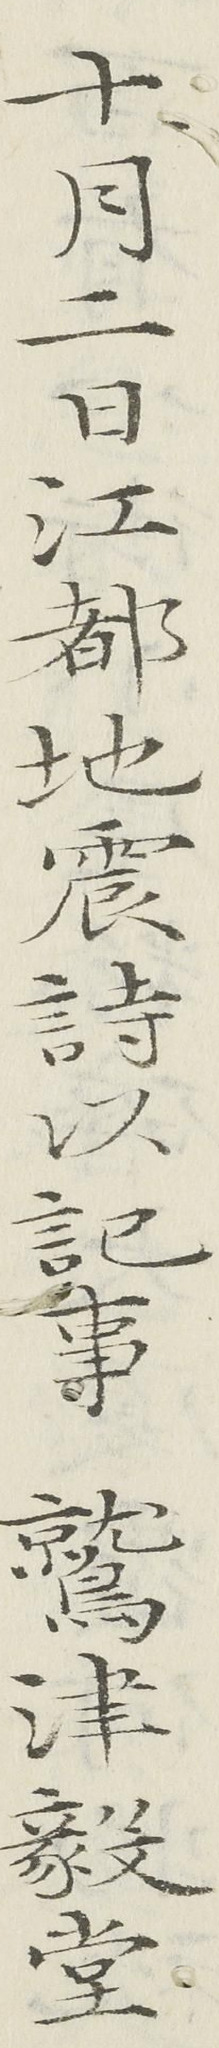十月二日江都地震以記事鷲津毅堂
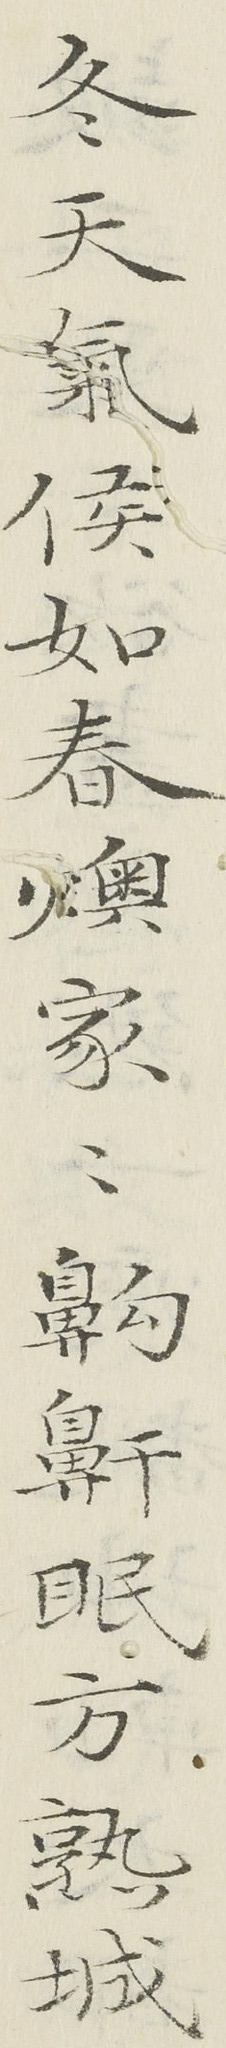冬天気候如春懊家々齁鼾眠方熟城

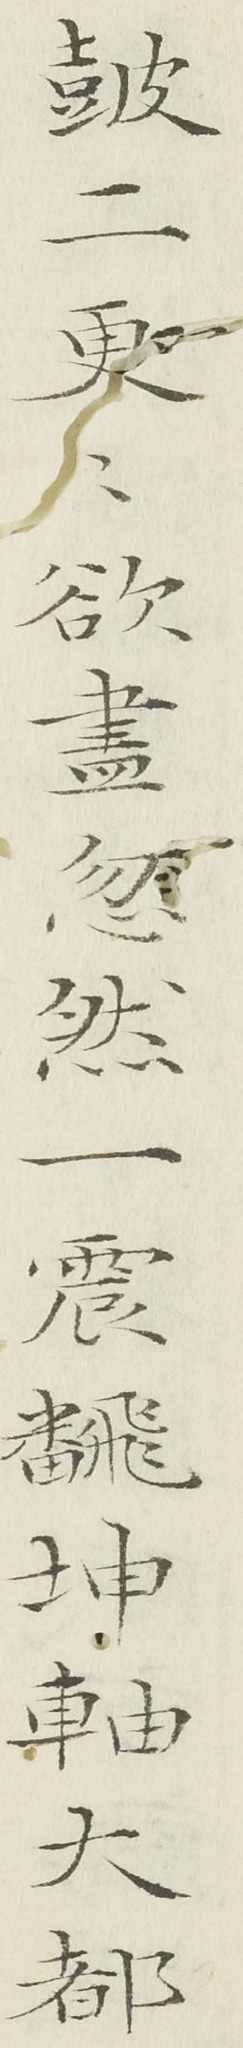皷二更々欲盡忽然一震翻坤軸大都
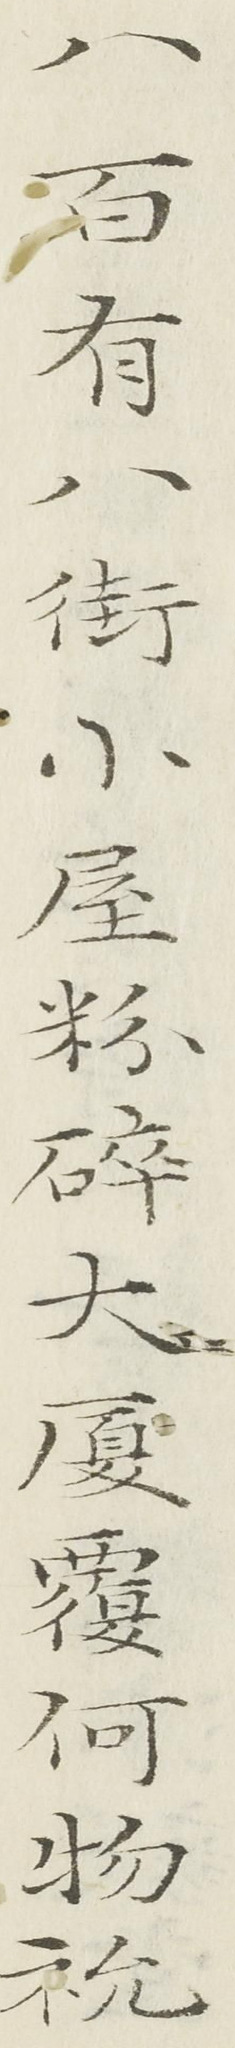ハ百有ハ街小屋粉砕大廈覆何物
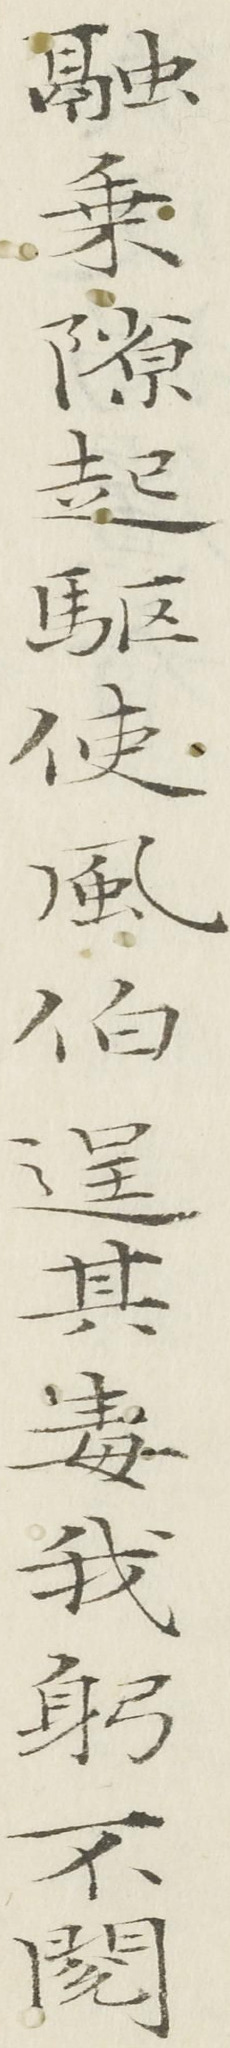融乗隙起駆使風伯逞其毒我躬不閲
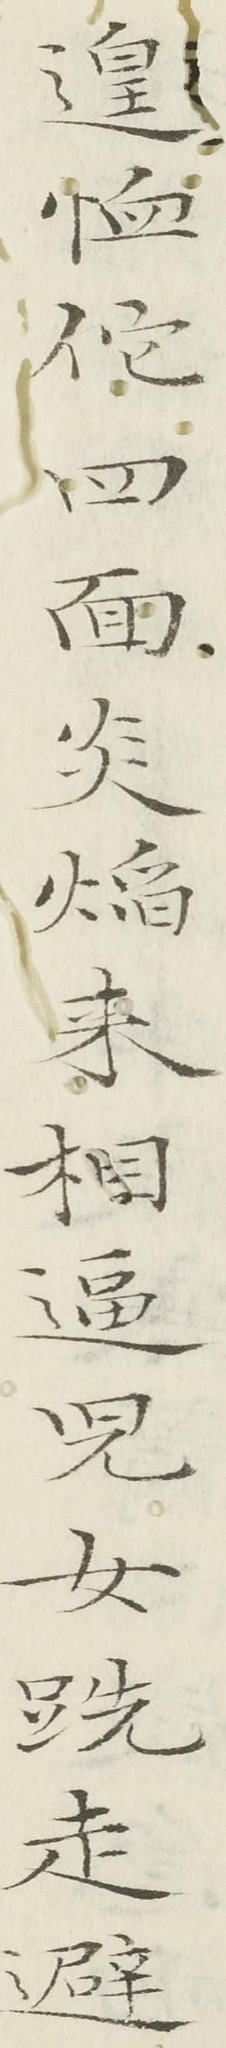遑恤侘四面炎焔来相逼児女跣走避
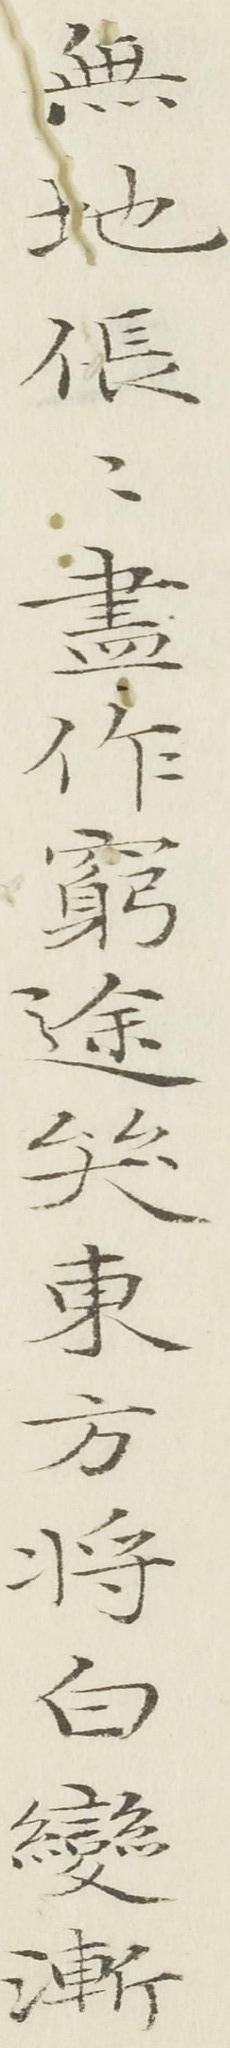無地倀々盡作窮途笑東方将白変漸
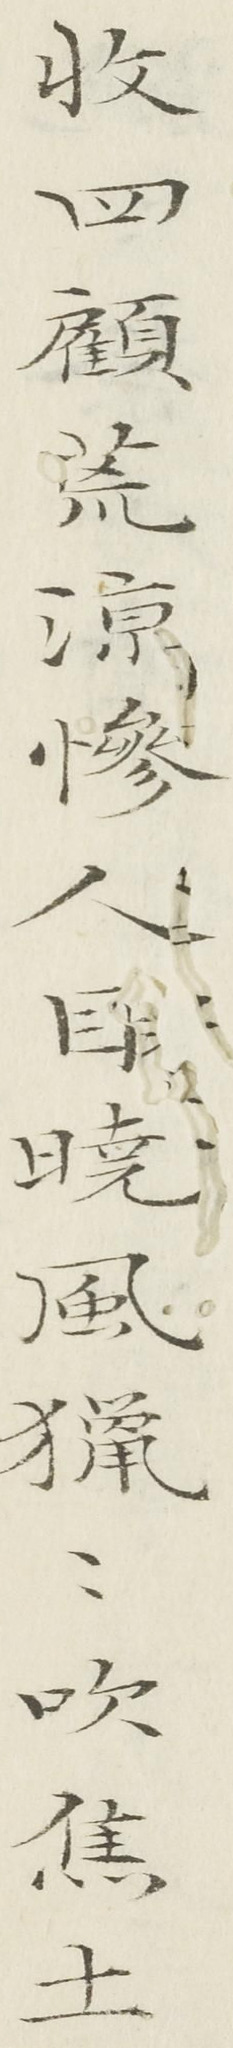収四顧荒涼惨人目暁風猟々吹焦土
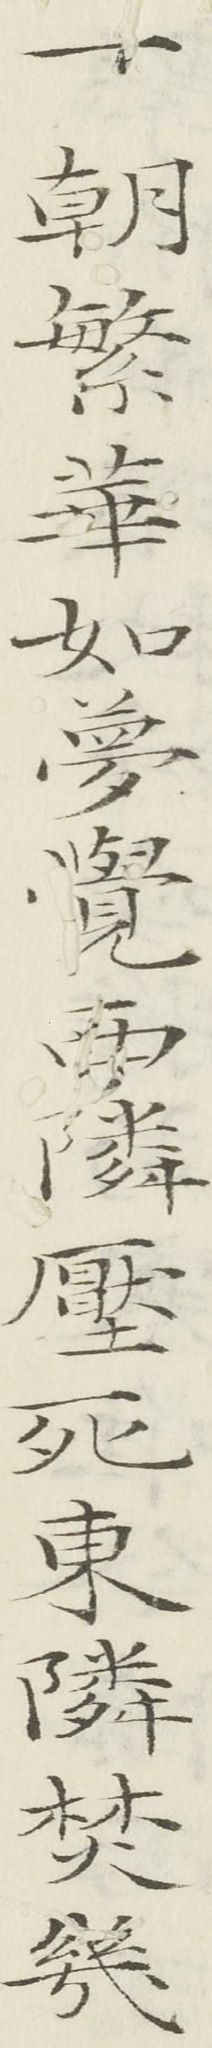一朝繁華如夢覚西隣圧死東隣焚幾
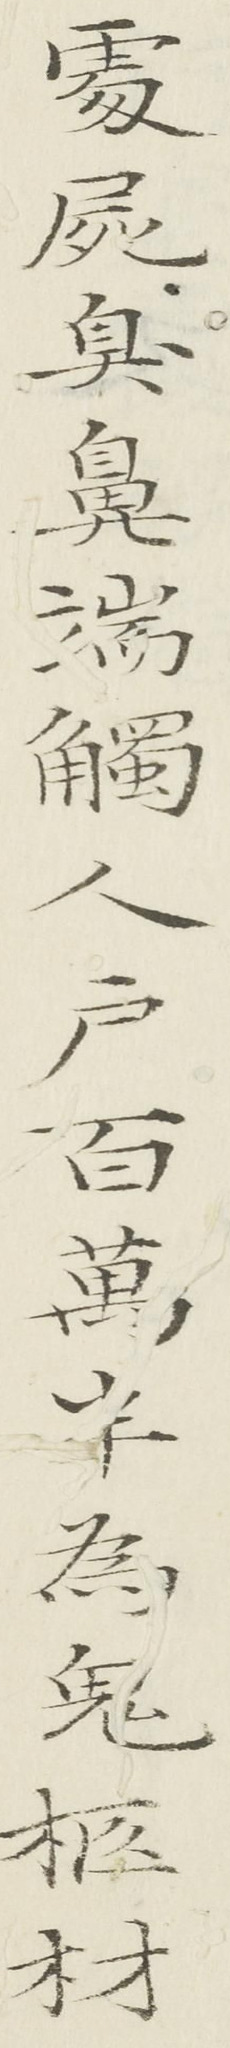処死臭鼻端触人戸百万半為鬼柩材
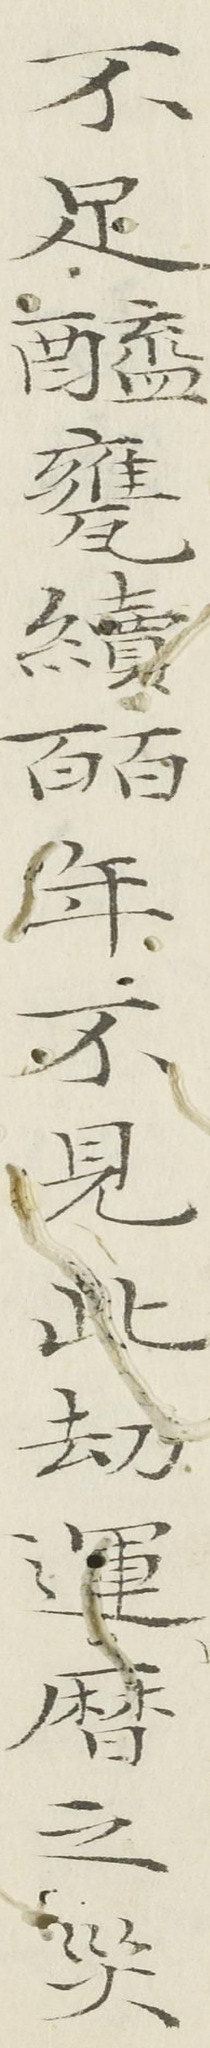不足醯甕続皕年不見此劫運暦之災
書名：地震考證　全
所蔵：東京大学地震研究所図書室 Earthquake Research Institute Library, The University of Tokyo, JAPAN
